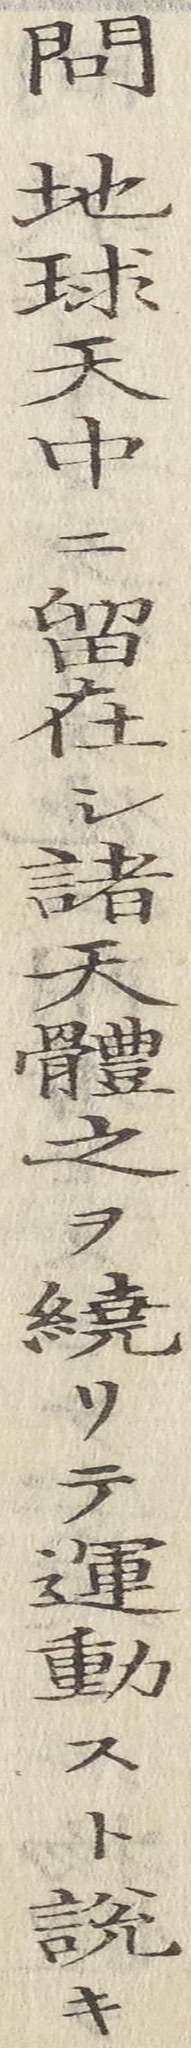問地球天中ニ留在シ諸天体之ヲ繞リテ運動スト説キ
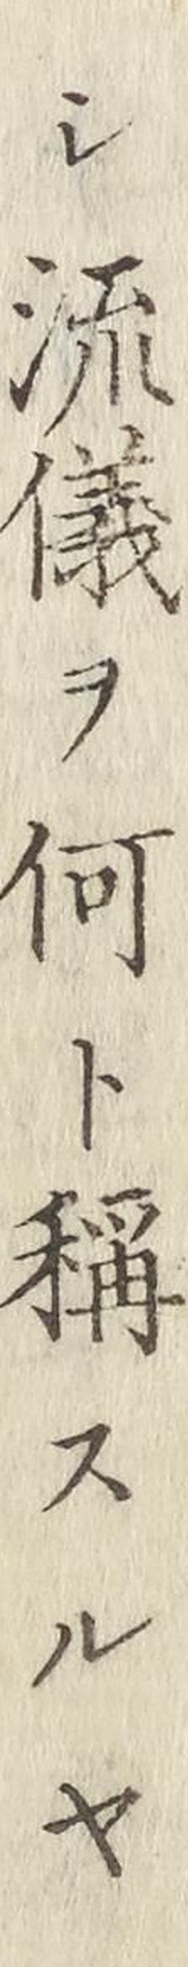シ流儀ヲ何ト称スルヤ
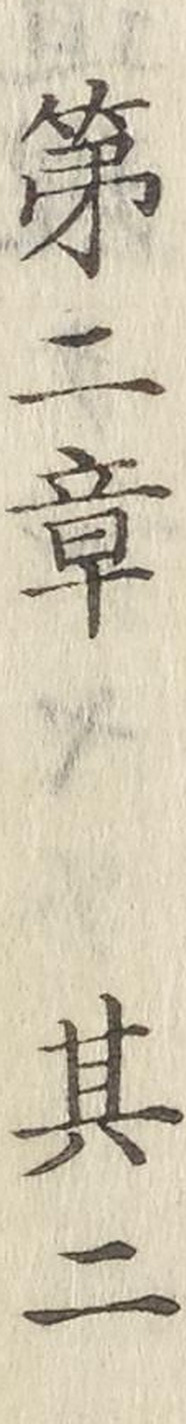第二章其二
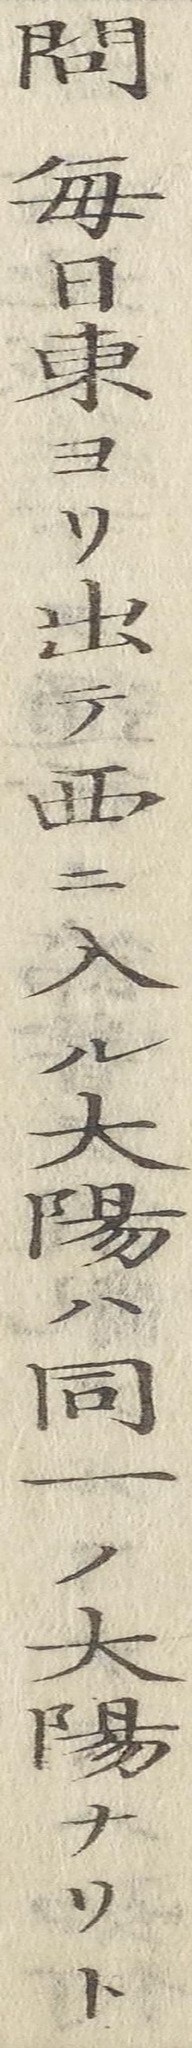問毎日東ヨリ出テ西ニ入ル大陽ハ同一ノ大陽ナリト
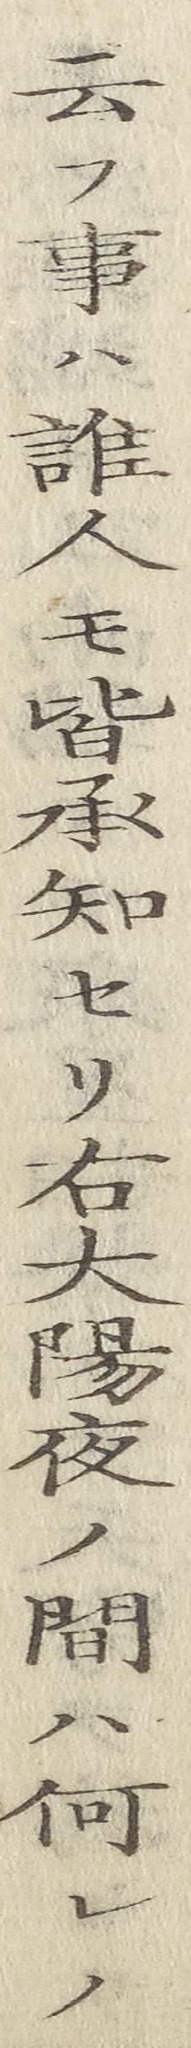云フ事ハ誰人モ皆承知セリ右大陽夜ノ間ハ何レノ
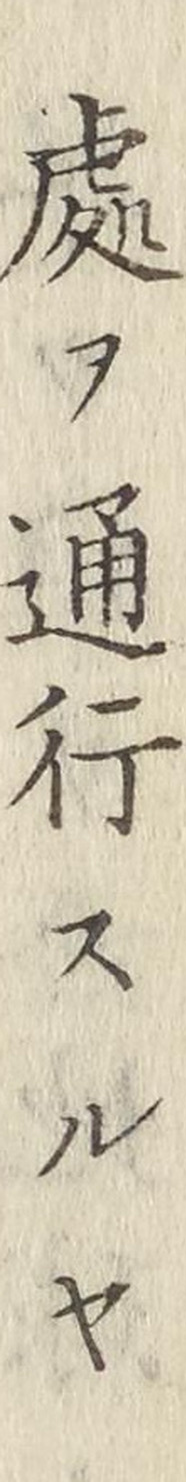処ヲ通行スルヤ
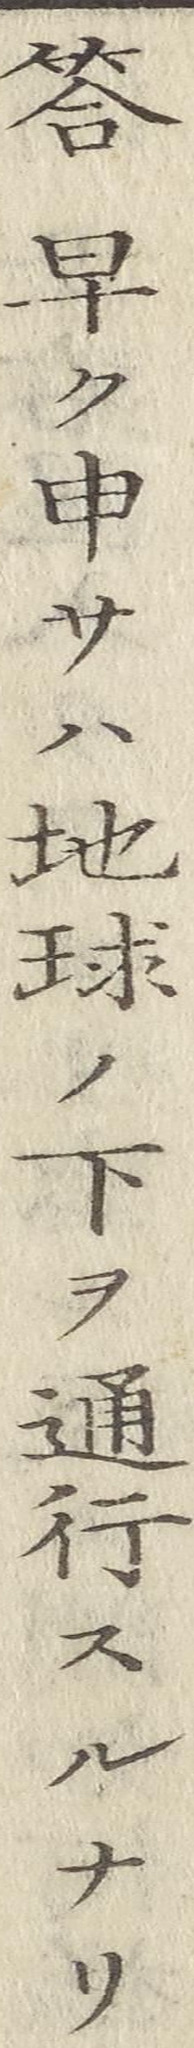答早ク申サハ地球ノ下ヲ通行スルナリ
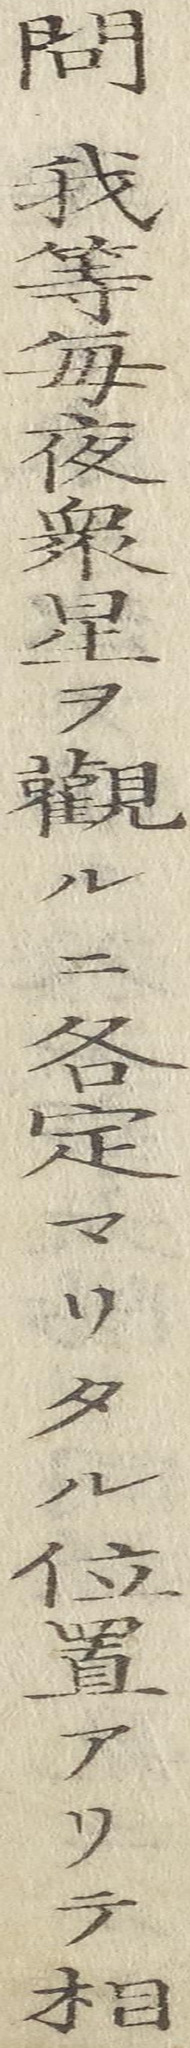問我等毎夜衆星ヲ観ルニ各定マリタル位置アリテ相

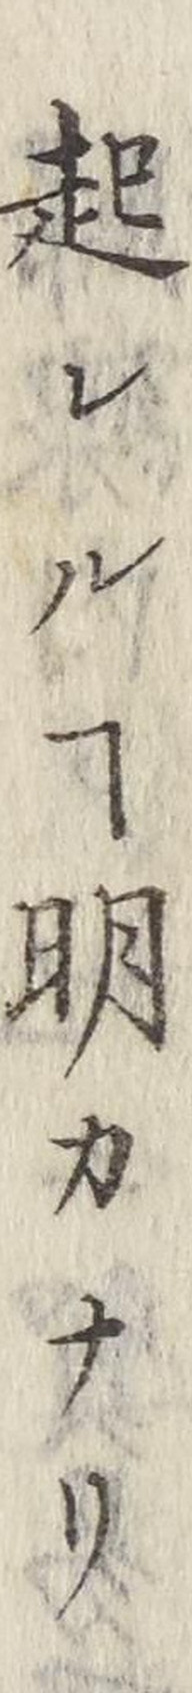起レルコト明カナリ
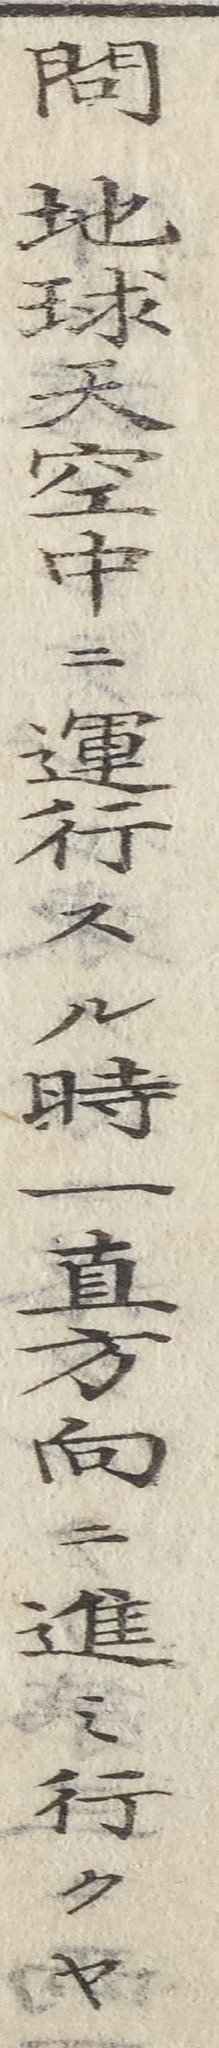問地球天空中ニ運行スル時一直方向ニ進ミ行クヤ
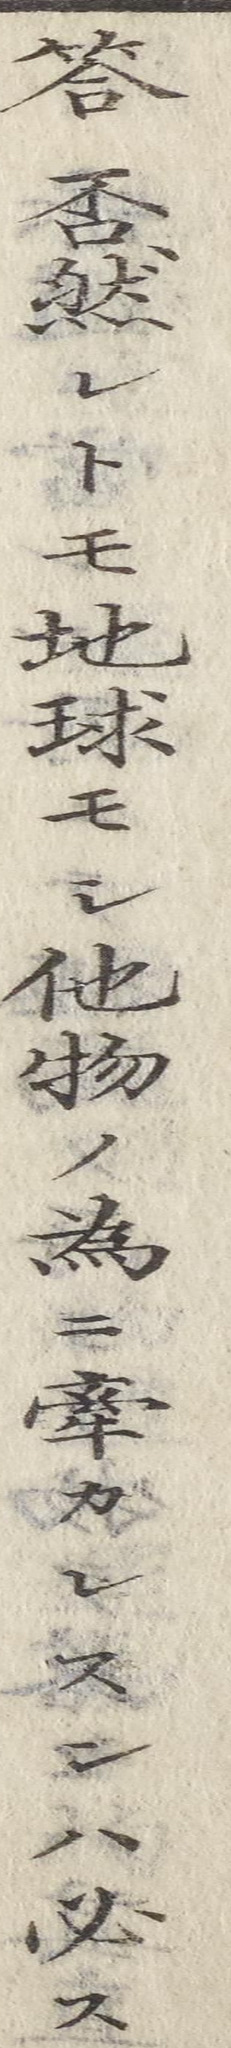答否然レトモ地球モシ他物ノ為ニ牽カレスンハ必ス
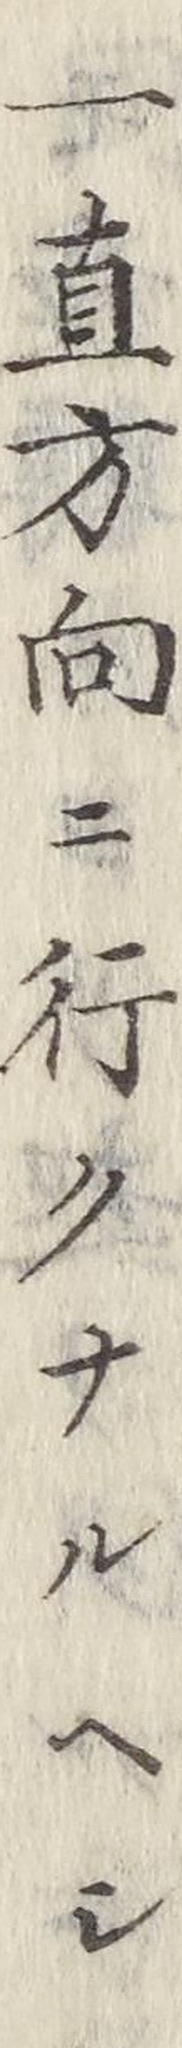一直方向ニ行クナルヘシ
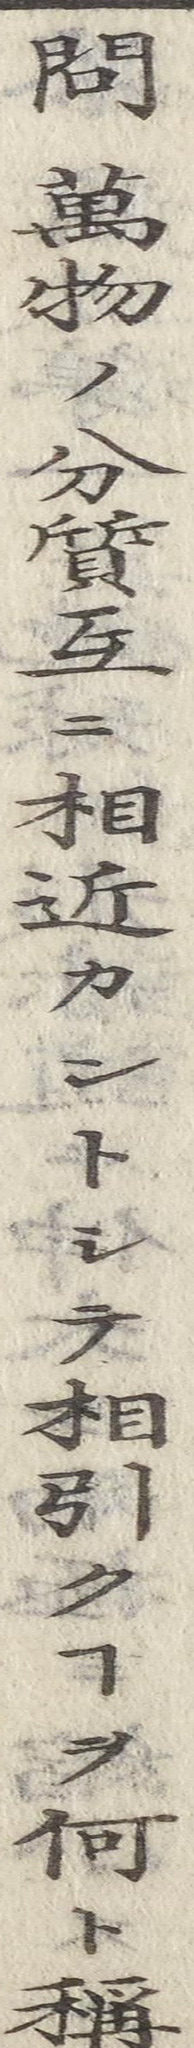問万物ノ分質互ニ相近カントシテ相引クコトヲ何ト称
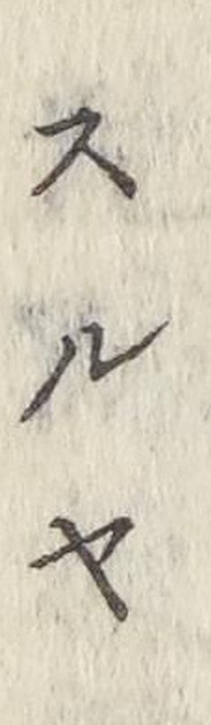スルヤ
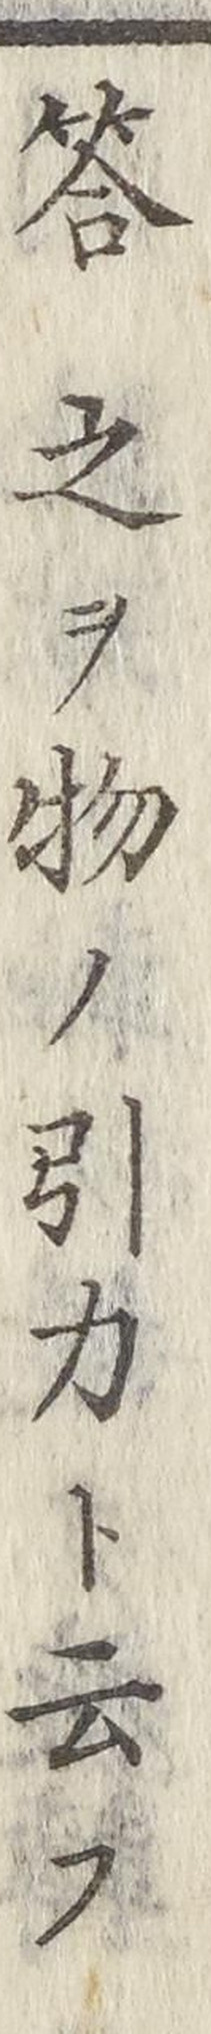答之ヲ物ノ引力ト云フ
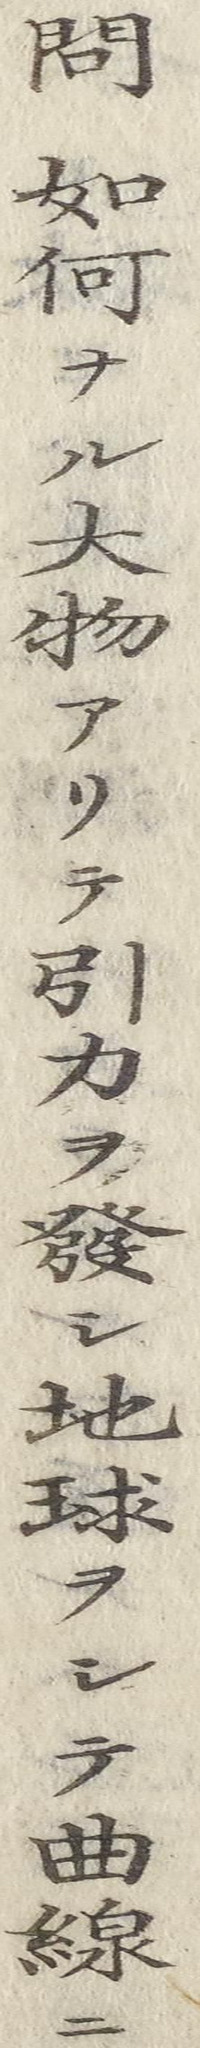問如何ナル大物アリテ引力ヲ発シ地球ヲシテ曲線ニ
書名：星学圖説　上
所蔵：東京大学地震研究所図書室 Earthquake Research Institute Library, The University of Tokyo, JAPAN
